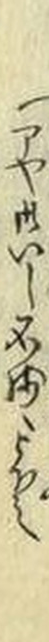部屋御いし不残へ被下之

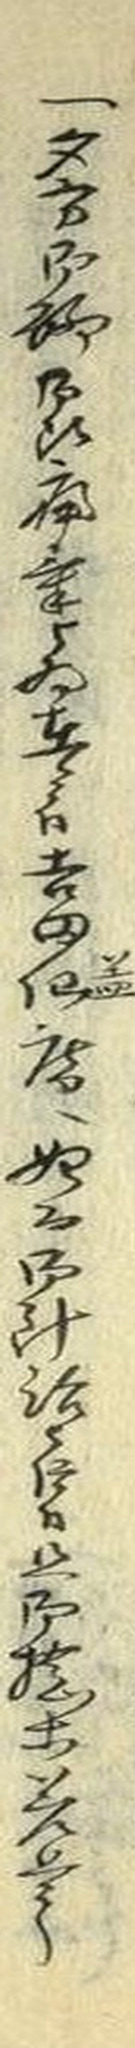一夕方御聊御頭痛気被為在候ニ付吉田仙庵へ始而御針治被仰付且御捻等差上之
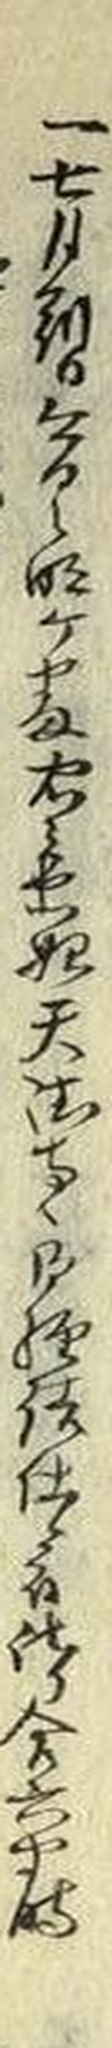一七月朔日今日之明ケ番忠兵衛始天徳寺へ御経詰仕候ニ付代り合六半時
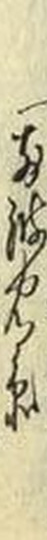前波忠兵衛
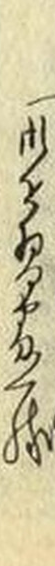御近習番一統
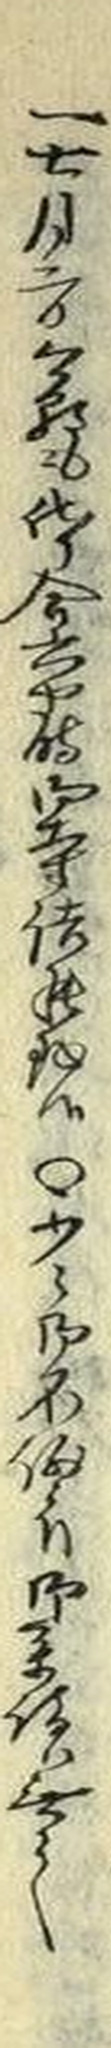一七月二日今朝も代り合六半時御寺詰罷越候〇少々御不例ニ付御参詣ハ無之
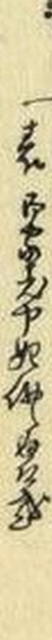表御家老中始例之通頂戴
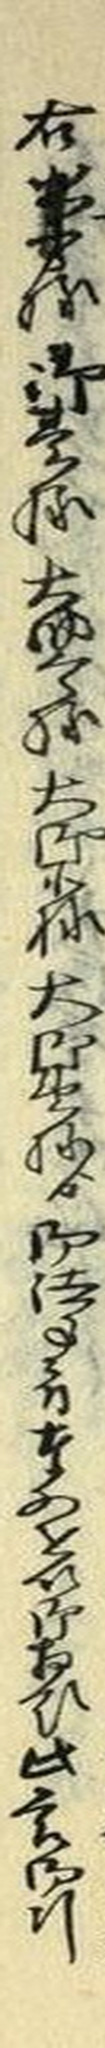右上様御台様大納言様大御所様大御台様ゟ御法事ニ付奉文を以御拝領此節御引
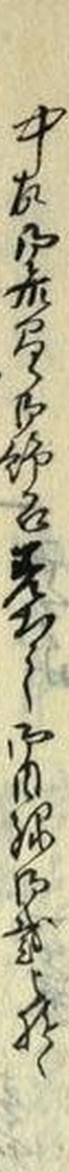中故御居間へ御飾召差出之御目録御戴被遊候
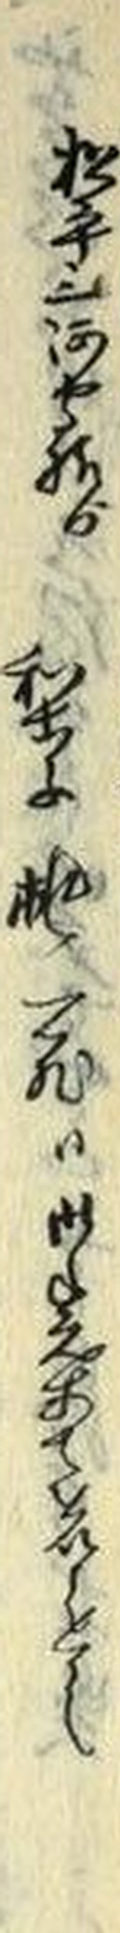松平三河守様ゟ梨子桃一籠同御手元使者を以被進之
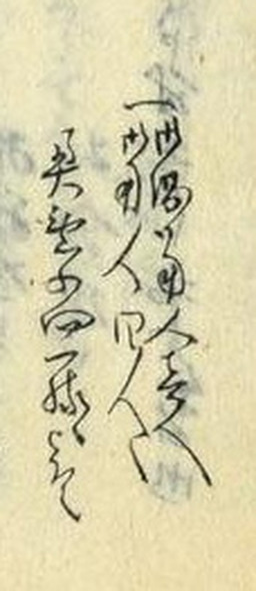御用人四人へ
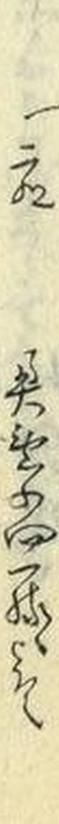二組奥台子向一統へ被下之
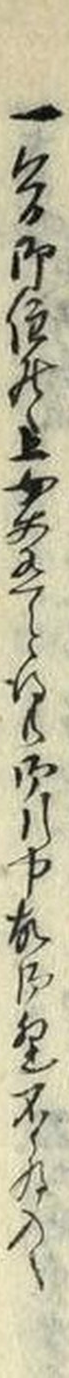一今日御住居へ上女使有之候得共御引中故御逢不被為入候
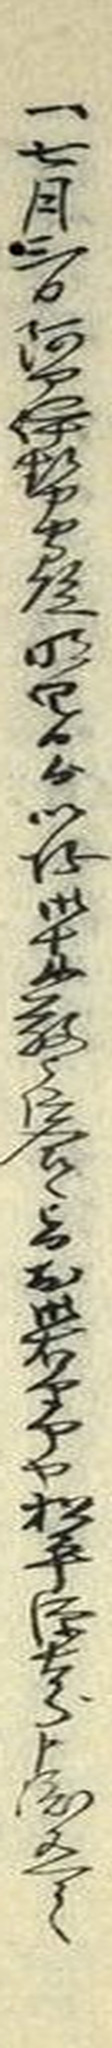一七月三日阿部伊勢守殿明四日ゟ以後御両敬被仰合候旨於御右筆部屋松平源太郎申渡有之
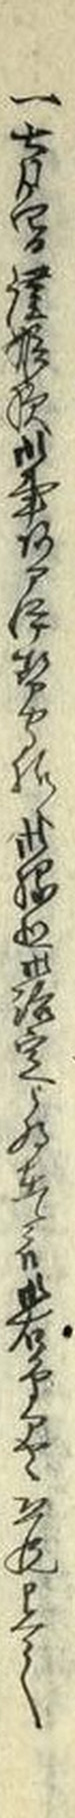一七月四日謹姫様御事阿部伊勢守様御縁組御治定被為在候ニ付御右筆部屋へ恐悦申上之
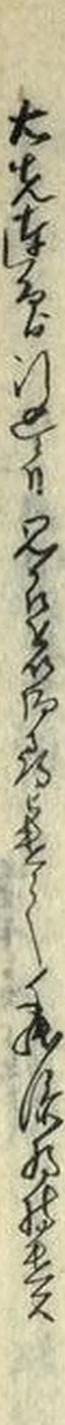右先達而ゟ引込ニ付思召を以御尋被遣之手紙添為持遣ス
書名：少傅日録抄（斉善付側向頭取日記、在府）
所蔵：福井県文書館 Fukui Prefectural Archives
